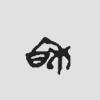秋
